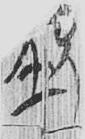○（兄）
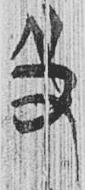及
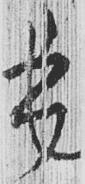弟
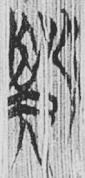淇（也）
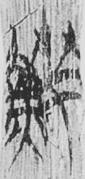鲜
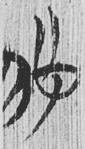我
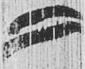二
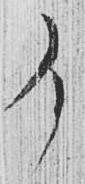人
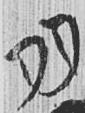多多
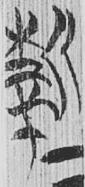薪薪
